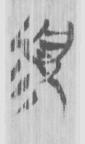須
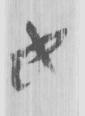女
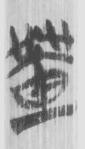{舛亼車}
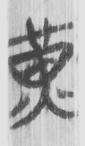黃
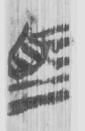馬
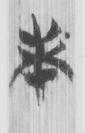未
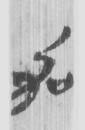加
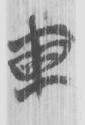車
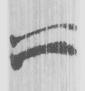二
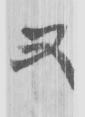又
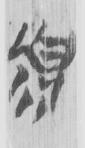須
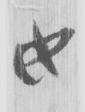女
